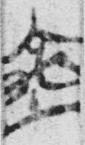○（禹）
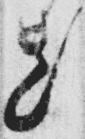也
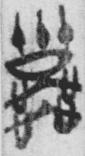○（契）
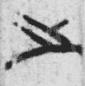之
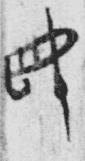母
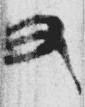又（有）
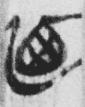○（娀）
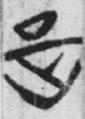是（氏）
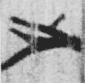之
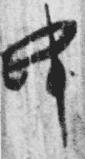女
